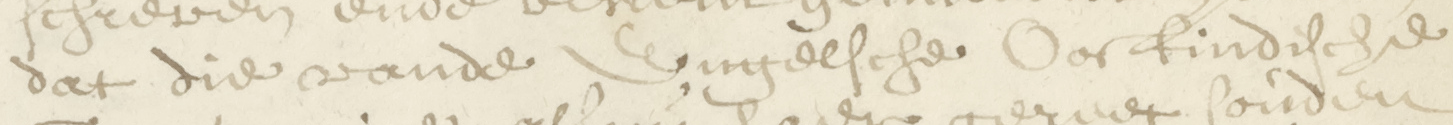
dat die vande Engelsche Oostindische
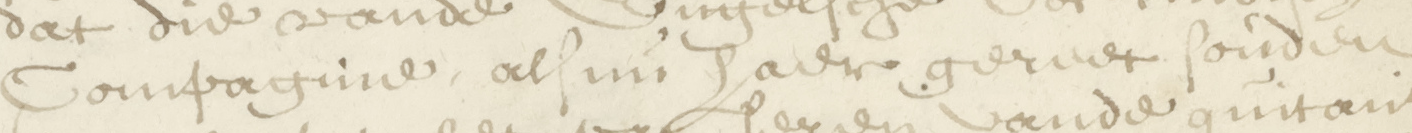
Compagnie, als nu haer gereet souden
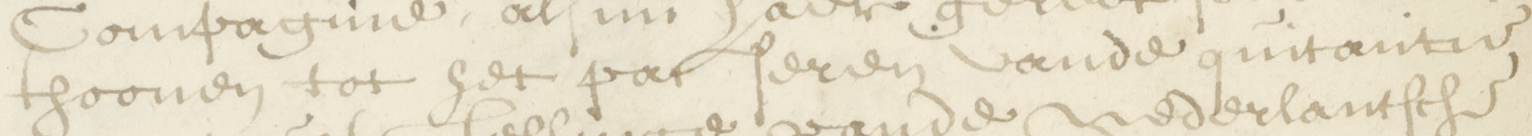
thoonen tot het passeren vande quitantie
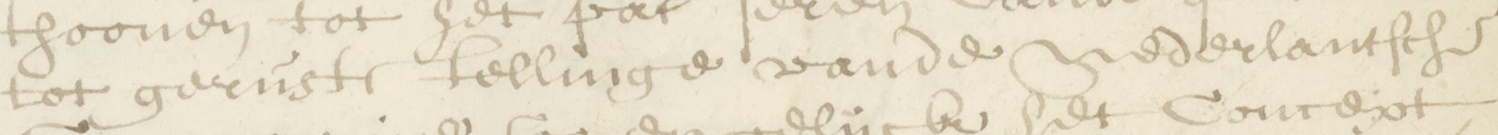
tot geruststellinge vande Nederlantsche
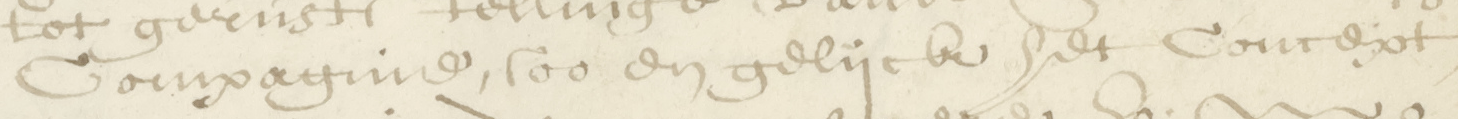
Compagnie, soo en gelijck het concept
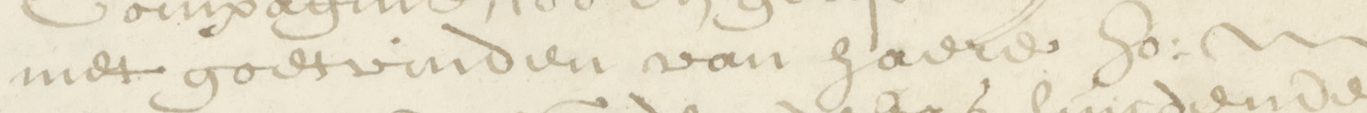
met goetvinden van haere Ho:Mo:
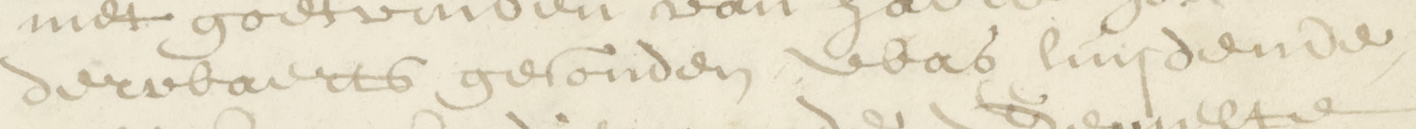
derwaerts gesonden was luijdende
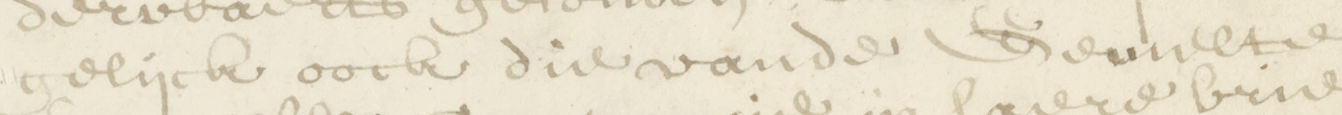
gelijck oock die vande Gemelte
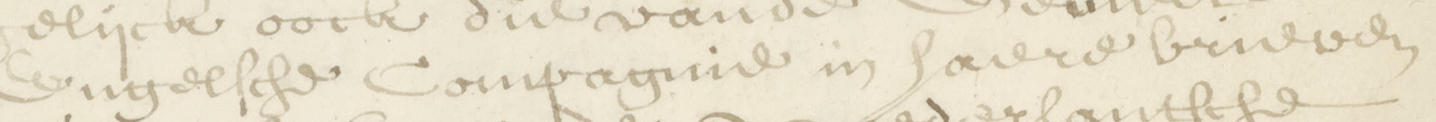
Engelsche Compagnie in haere brieven
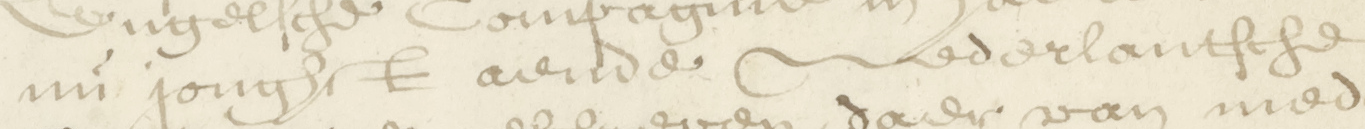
nu jonghst aende Nederlantsche
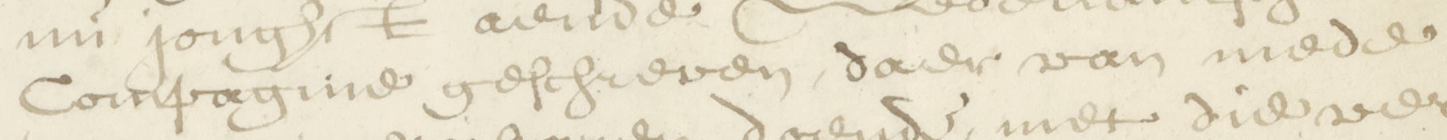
Compagnie geschreven daer van mede
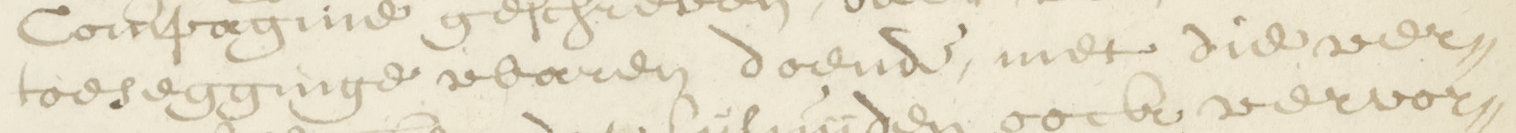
toesegginge waren doende, met die ver„
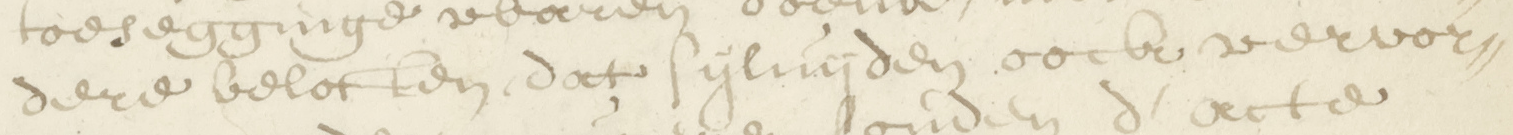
dere beloften, dat sijluijden oock vervor„
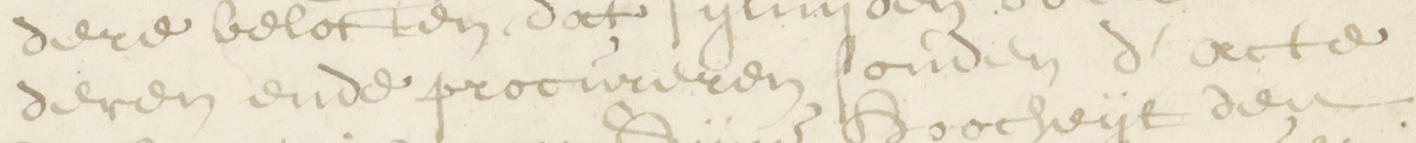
deren ende procureren souden d'acte
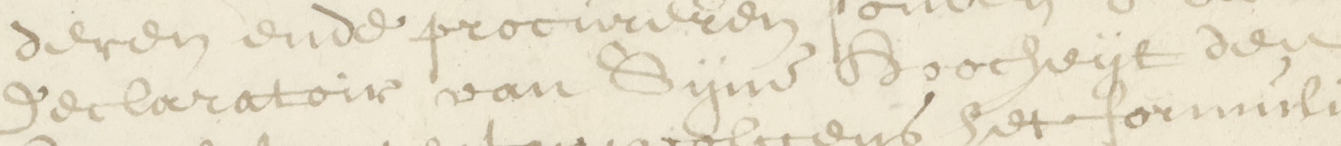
Declaratoir van Sijne Hoocheijt den
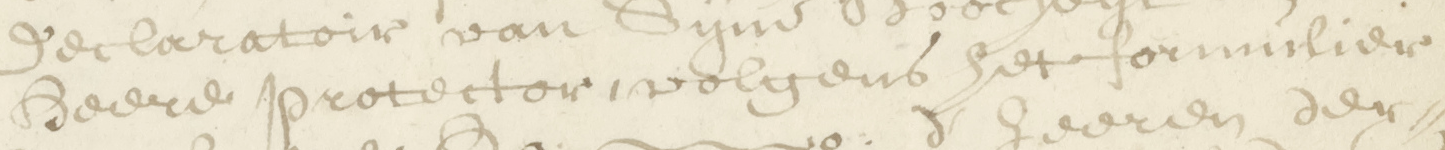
Heere protector, volgens het formulier
